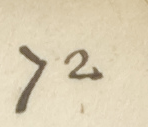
72
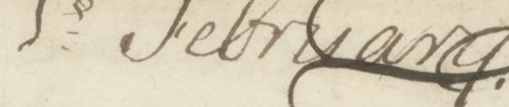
1e. Februari.
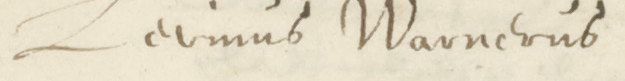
Levinus Warnerus
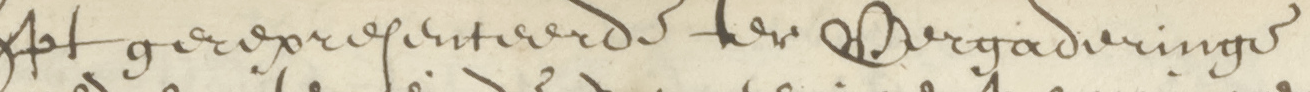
Opt gerepresenteerde ter Vergaderinge
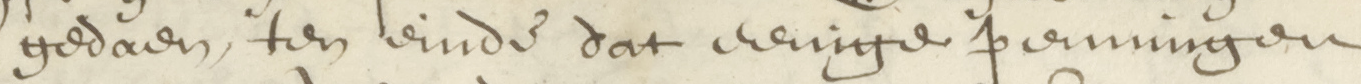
gedaen, ten einde dat eenige penningen
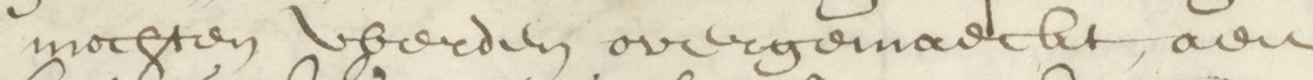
mochten werden overgemaeckt, aen
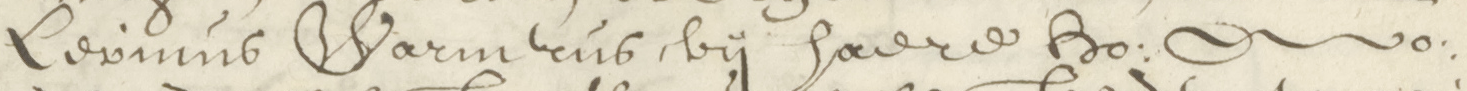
Levinus Warnerus, bij haere Ho:Mo:
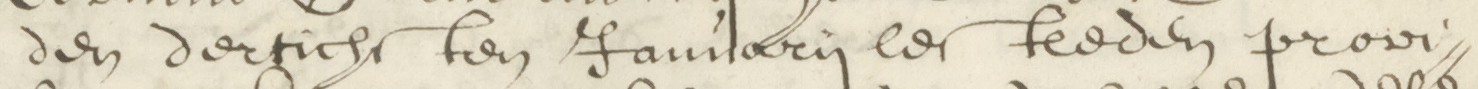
den dertichsten Januarij lestleden provi„
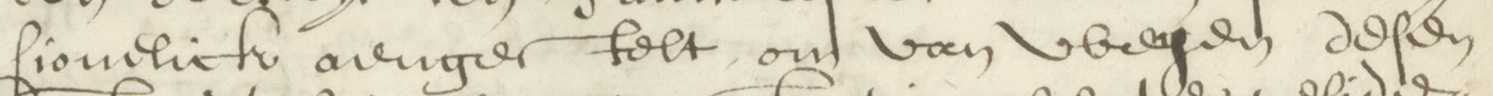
sionelick aengestelt om van wegen desen
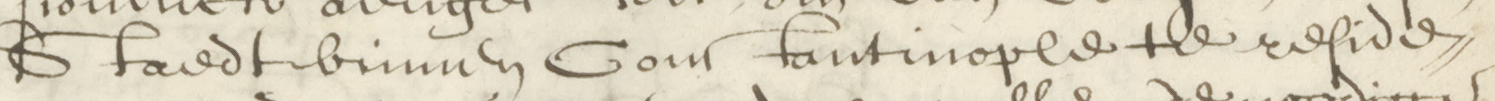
Staedt binnen Constantinople te reside„
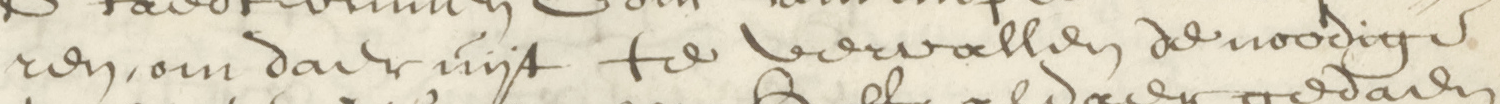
ren, om daer uijt te vervallen de noodige
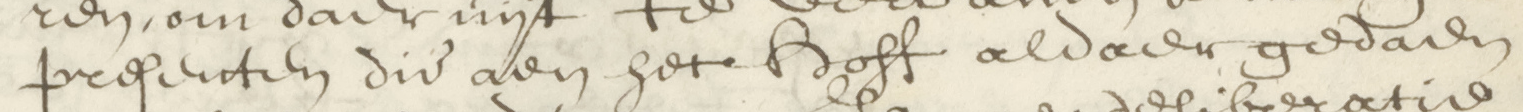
presenten die aen het Hoff aldaer gedaen
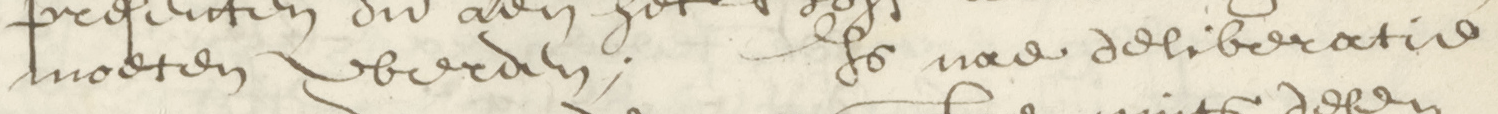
moeten werden; Is nae deliberatie
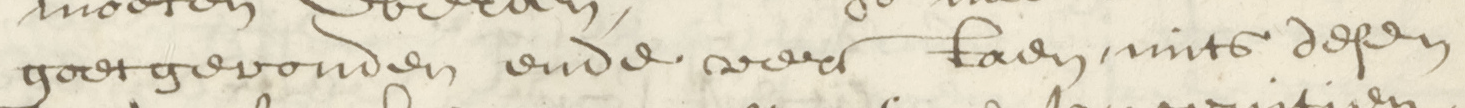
goetgevonden ende verstaen, mits desen
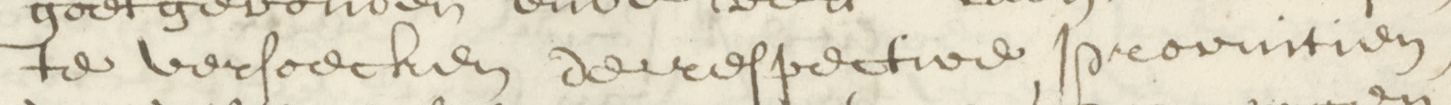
te versoecken de respective Provintien,
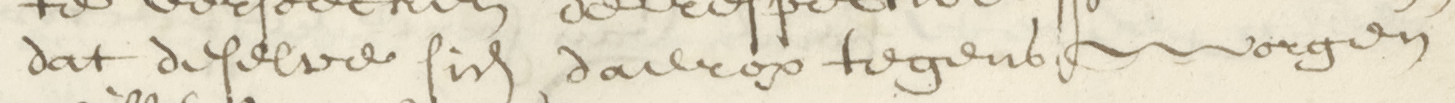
dat deselve sich daerop tegens morgen
